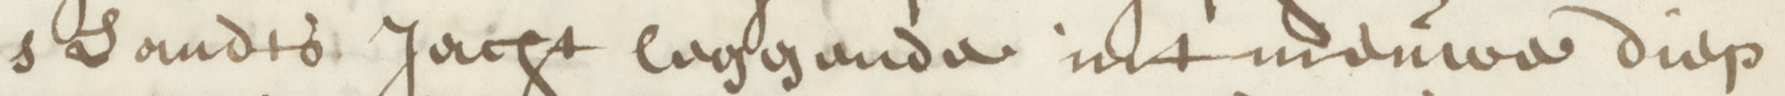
sLandts Jacht leggende int nieuwe diep.
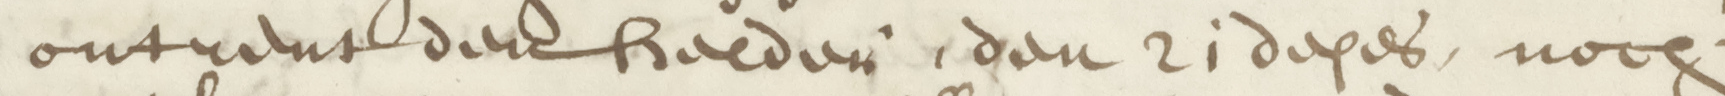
ontrent den helder, den 21 deses, noch
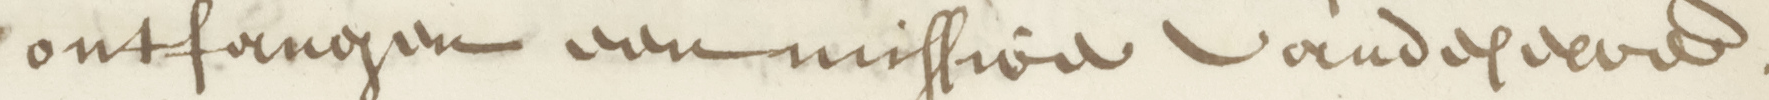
ontfangen een missive van deselve
